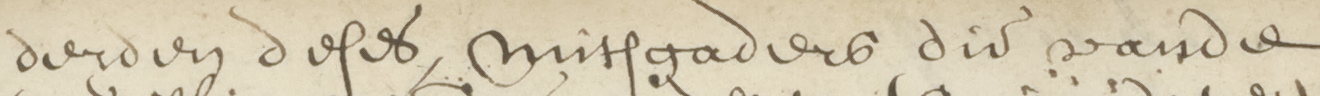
derden deses, mitsgaders die vande
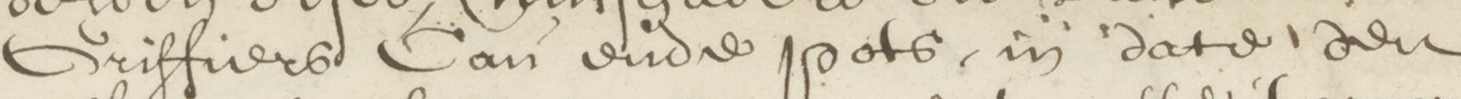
Griffiers Can ende Pots, in date den
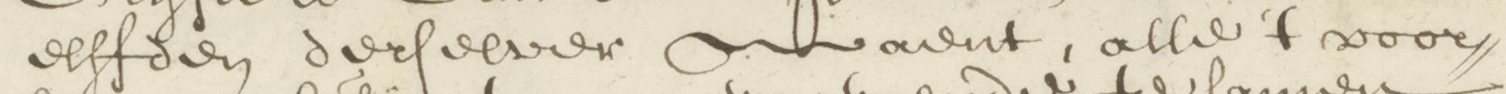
elffden derselver Maent, alle ‛t voor„
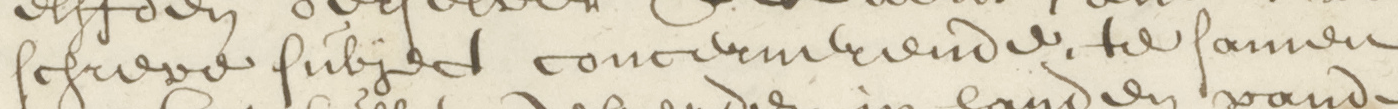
schreve subject concernerende, te samen
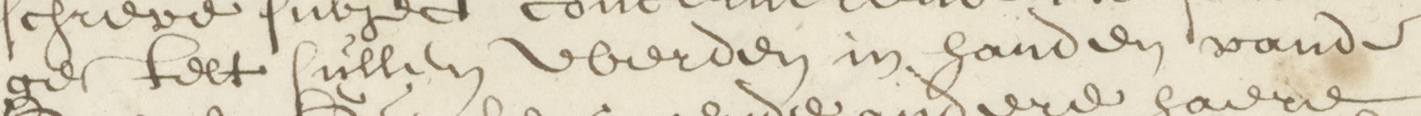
gestelt sullen werden in handen vande
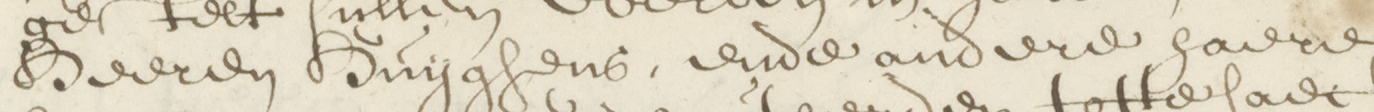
Heeren Huijghens, ende andere haere
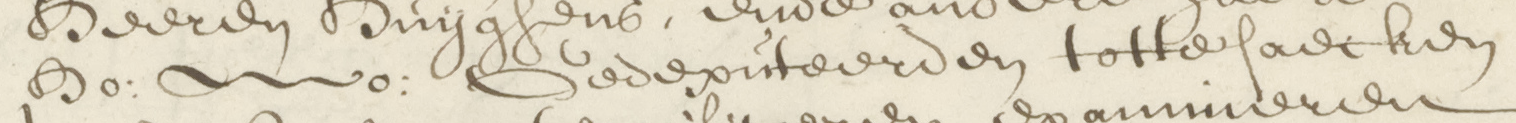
Ho:Mo: Gedeputeerden totte saecken
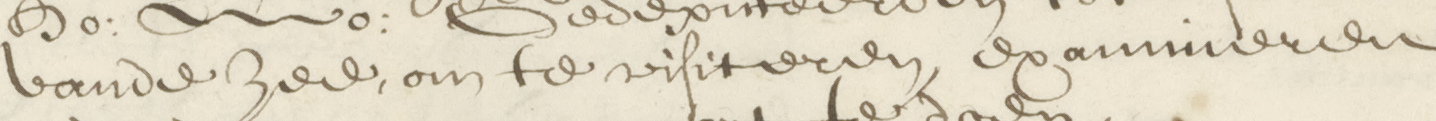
vande Zee, om te visiteren, examineren
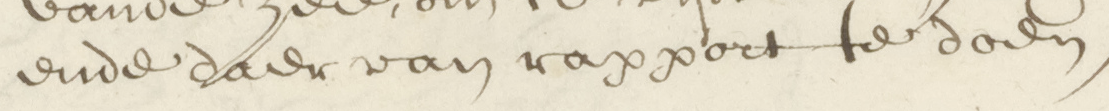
ende daer van rapport te doen.
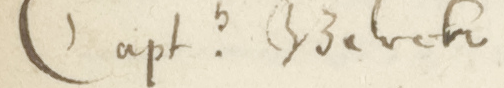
Captn. Berck
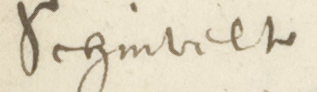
Schinvelt
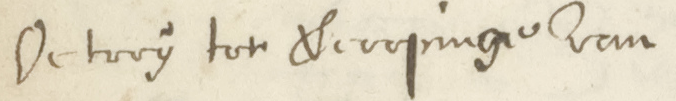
Octroij ter vcoopinge van
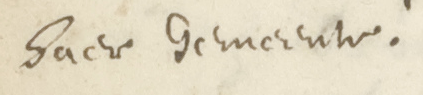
haer Gemeente.
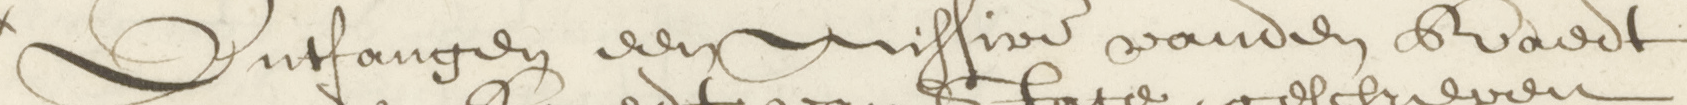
Ontfangen een Missive vanden Raedt
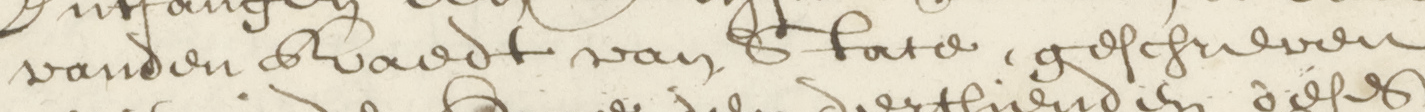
vanden Raedt van State, geschreven
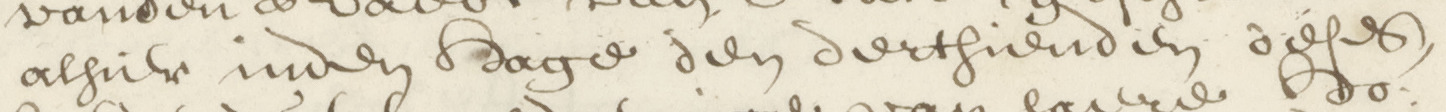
alhier inden Hage den derthienden deses,
